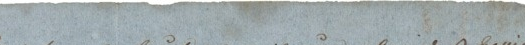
wirklich auch gerne dabei seyn
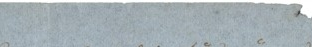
mögen. Um so mehr
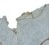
freut
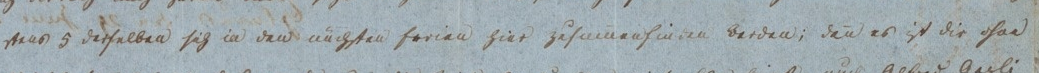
stens 5 derselben sich in den nächsten Ferien hier zusammenfinden werden; denn es ist Dir ohne
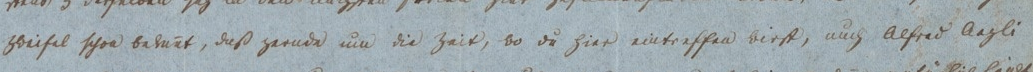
Zweifel schon bekannt, daß gerade um die Zeit, wo Du hier eintreffen wirst, auch Alfred Aepli
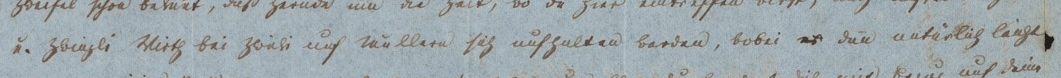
u. Zwingli Wirth bei Zwicki auf Mullern sich aufhalten werden, wobei es dann natürlich leicht
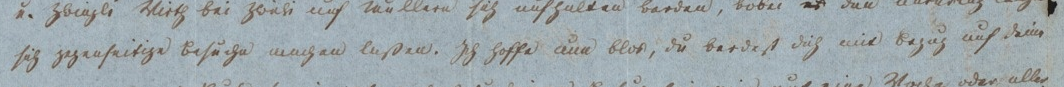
sich gegenseitige Besuche machen lassen. Ich hoffe nun blos, Du werdest Dich mit Bezug auf Deine
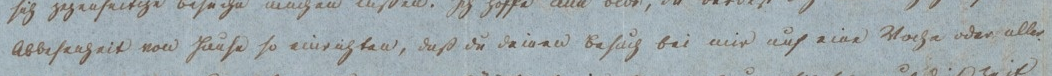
Abwesenheit von Hause so einrichten, daß Du Deinen Besuch bei mir auf eine Woche oder aller-
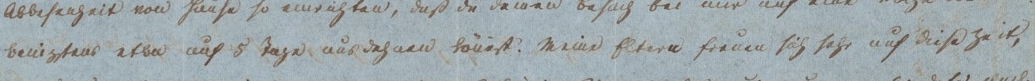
wenigstens etwa auf 5 Tage ausdehnen könnest. Meine Eltern freuen sich sehr auf diese Zeit,
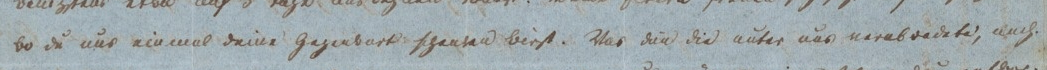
wo Du uns einmal Deine Gegenwart schenken wirst. Was dann die unter uns verabredete, nach-
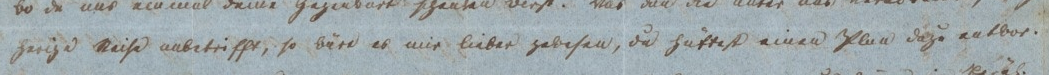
herige Reise anbetrifft, so wäre es mir lieber gewesen, Du hättest einen Plan dazu entwor-
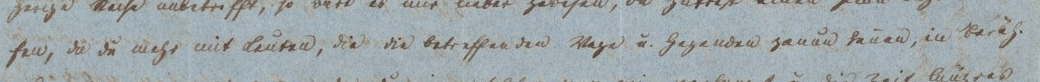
fen, da Du mehr mit Leuten, die die betreffenden Wege u. Gegenden genau kennen, in Berüh-
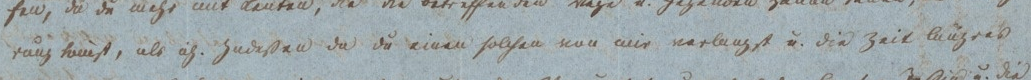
rung kommst, als ich. Indessen da Du einen solchen von mir verlangst u. die Zeit längres
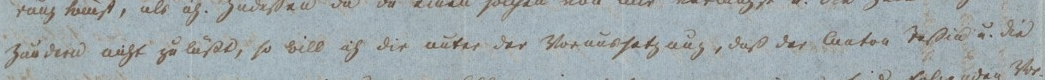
Zaudern nicht zuläßt, so will ich Dir unter der Voraussetzung, daß der Canton Tessin u. die
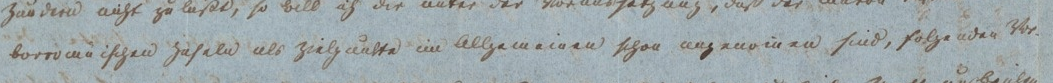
borromäischen Inseln als Zielpunkte im Allgemeinen schon angenommen sind, folgenden Vor-
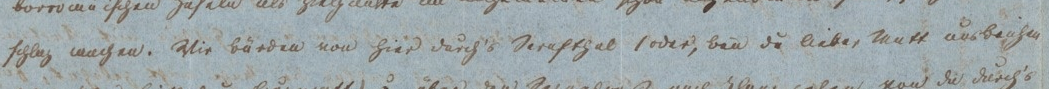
schlag machen. Wir würden von hier durch's Sernfthal (oder, wenn Du lieber Matt ausweichen
